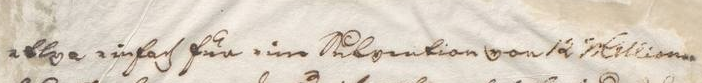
etwa einfach für eine Subvention von 12 Millionen
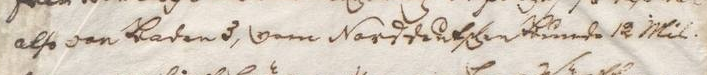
also von Baden 3, vom Norddeutschen Bunde 12 Mil-
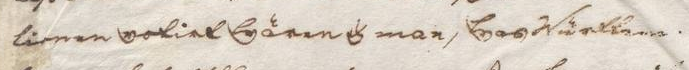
lionen votirt wären & man, was Württem-
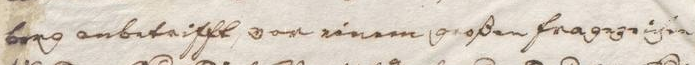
berg anbetrifft, vor einem großen Fragezeichen
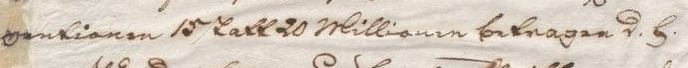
ventionen 15 statt 20 Millionen betragen d. h.
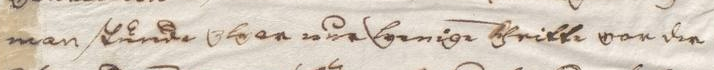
man stünde zwar nur wenige Schritte vor der
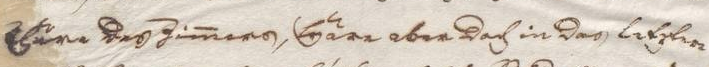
Thüre des Zimmers, wäre aber doch in das letztere
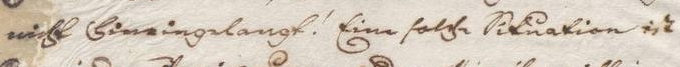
nicht hineingelangt! Eine solche Situation ist
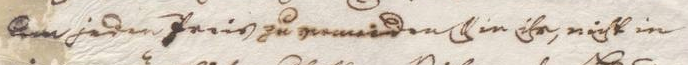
um jeden Preis zu vermeiden & in ihr, nicht in
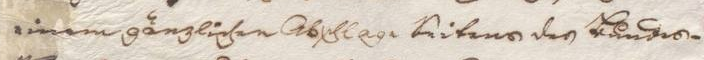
einem gänzlichen Abschlage Seitens des Bundes-
